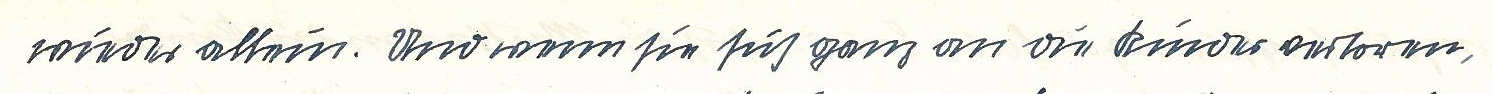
wieder allein. Und wenn sie sich ganz an die Kinder verloren,
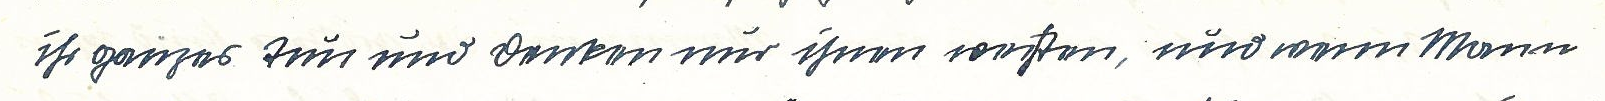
ihr ganzes Tun und Denken nur ihnen weihten, und wenn Mann
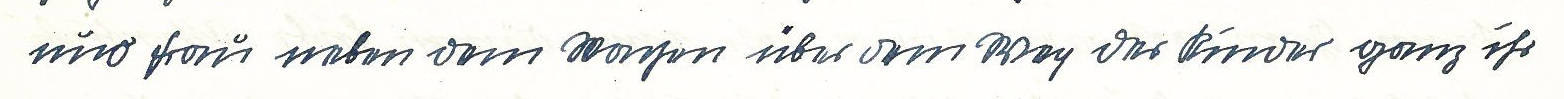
und Frau neben dem Wachen über dem Weg der Kinder ganz ihr
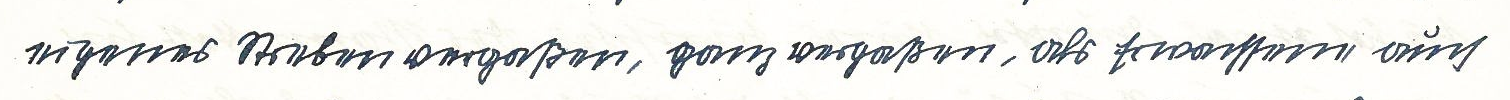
eigenes Streben vergaßen, ganz vergaßen, als Erwachsene auch
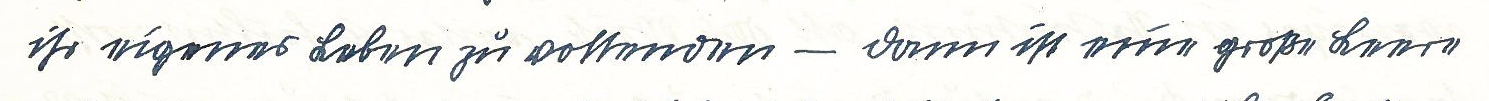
ihr eigenes Leben zu vollenden – dann ist eine große Leere
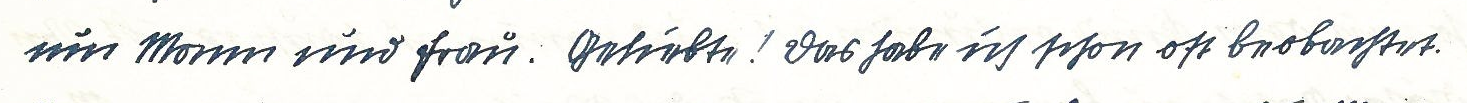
um Mann und Frau. Geliebte! Das habe ich schon oft beobachtet.
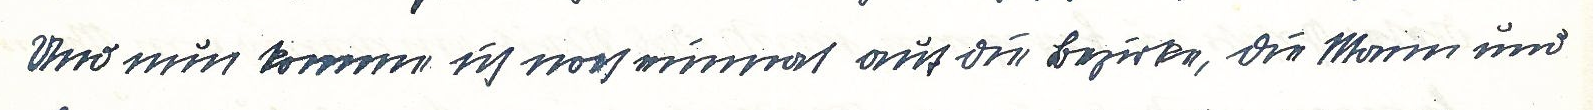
Und nun komme ich noch einmal auf die Bezirke, die Mann und
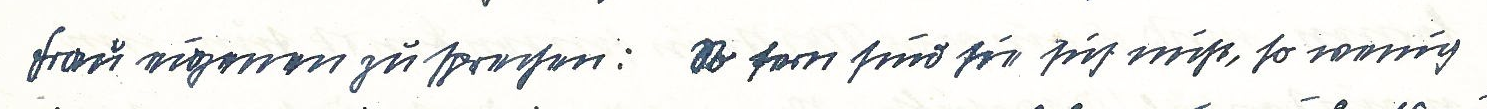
Frau eigenen zu sprechen: So fern sind sie sich nicht, so wenig
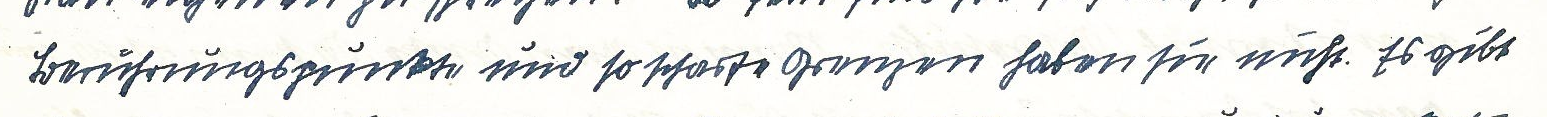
Berührungspunkte und so scharfe Grenzen haben sie nicht. Es gibt
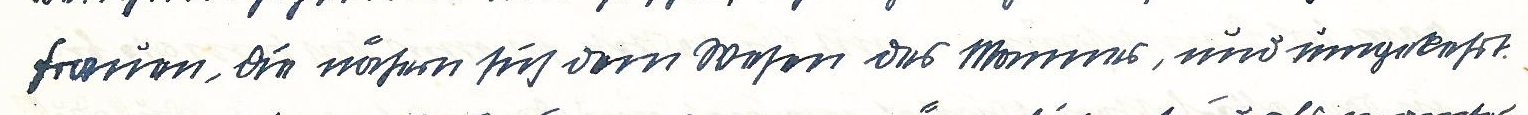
Frauen, die nähern sich dem Wesen des Mannes, und umgekehrt.
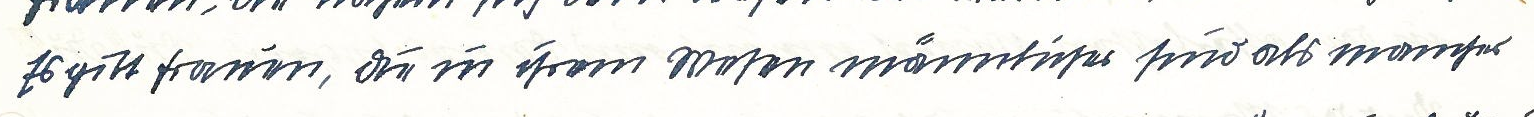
Es gibt Frauen, die in ihrem Wesen männlicher sind als mancher
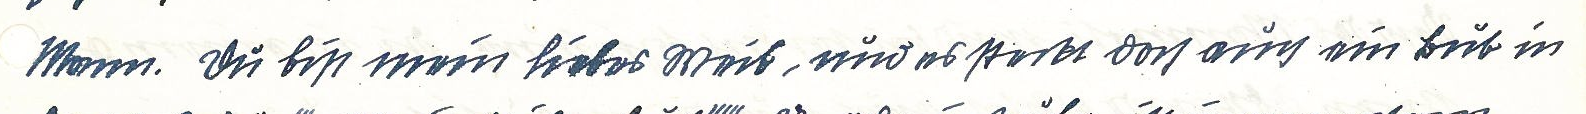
Mann. Du bist mein liebes Weib, und es steckt doch auch ein Bub in
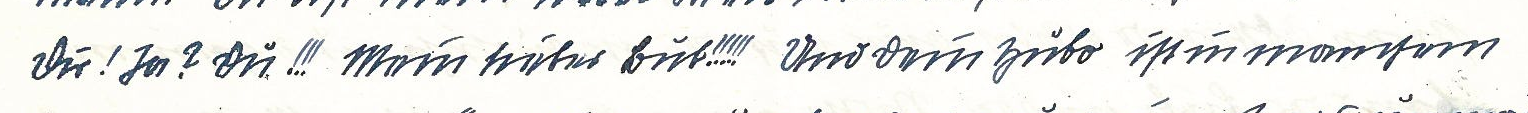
Dir! Ja? Du!!! Mein lieber Bub!!!!! Und Dein Hubo ist in manchem
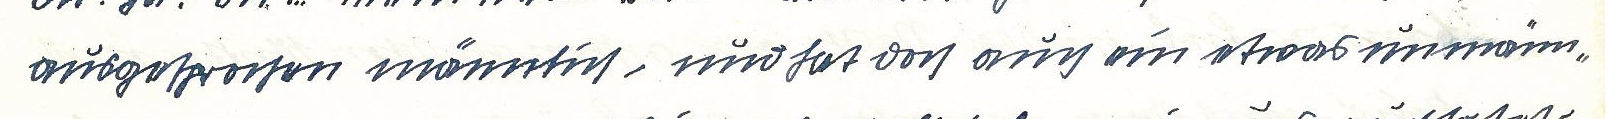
ausgesprochen männlich, und hat doch auch ein etwas unmänn¬
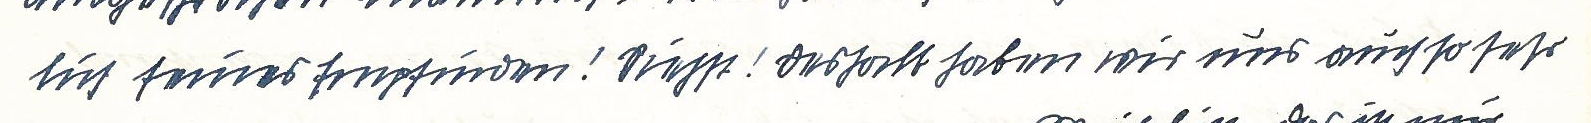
lich feines Empfinden! Siehst! Deshalb haben wir uns auch so sehr
